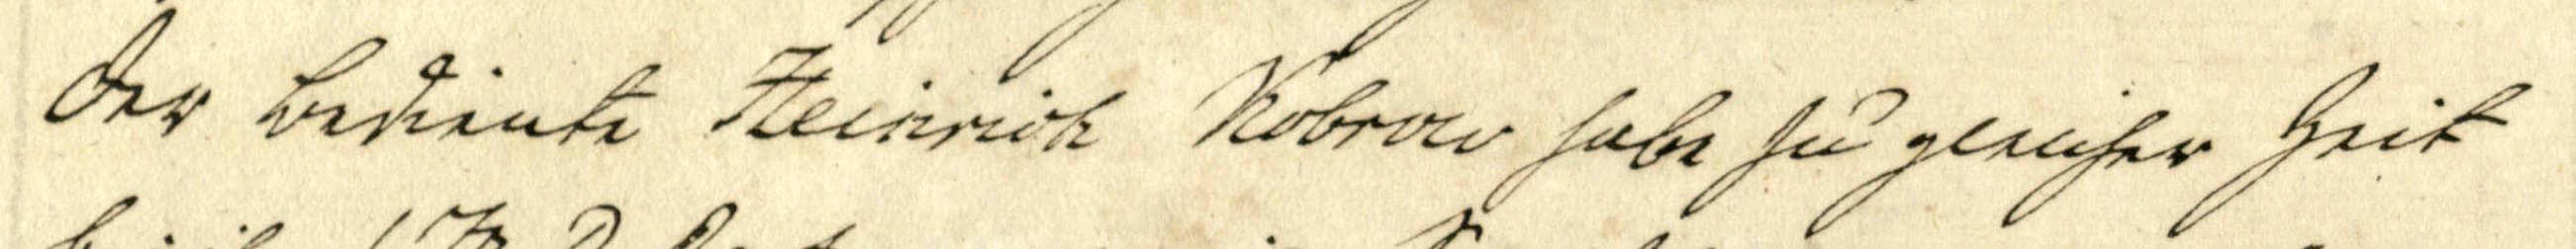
Der Bediente Heinrich Kobrow habe zu gleicher Zeit
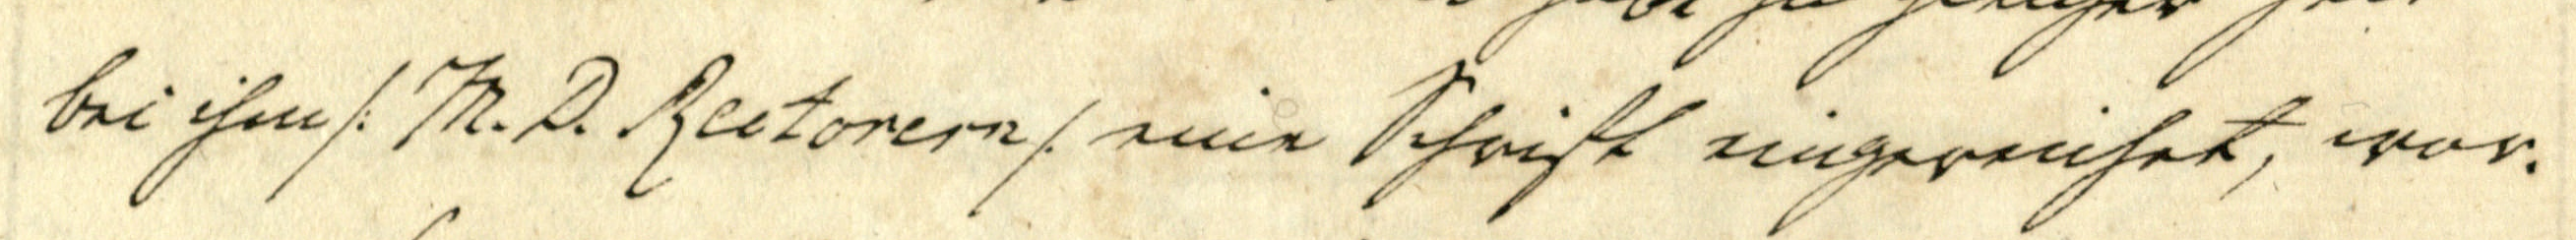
bei ihm / M. D. Rectorem / eine Schrift eingereichet, wor¬
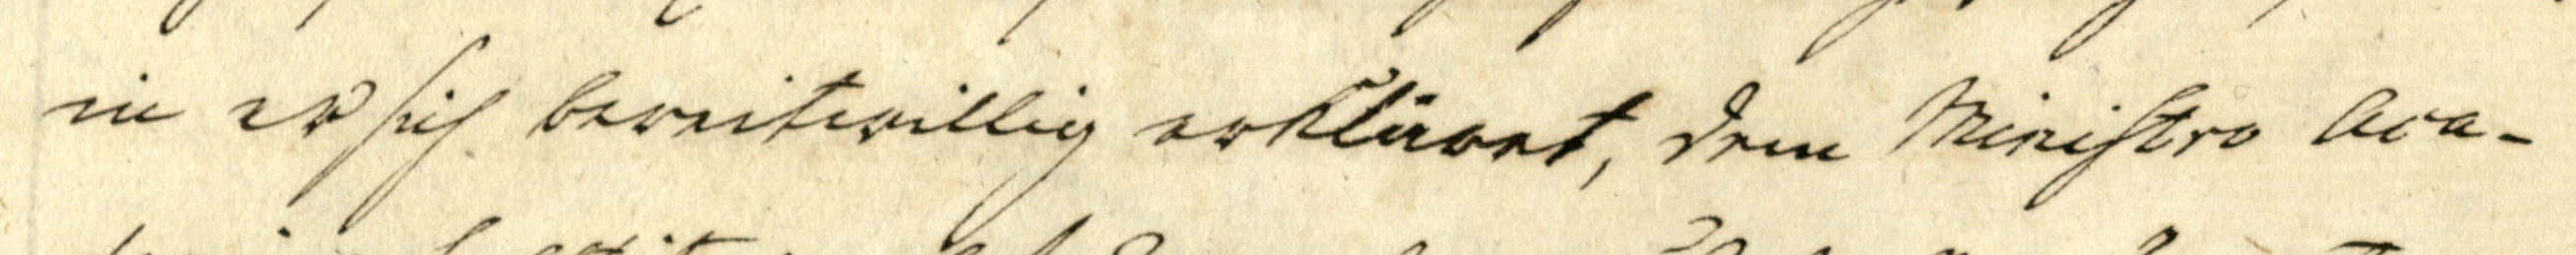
in er sich bereitwillig erkläret, dem Ministro Aca¬
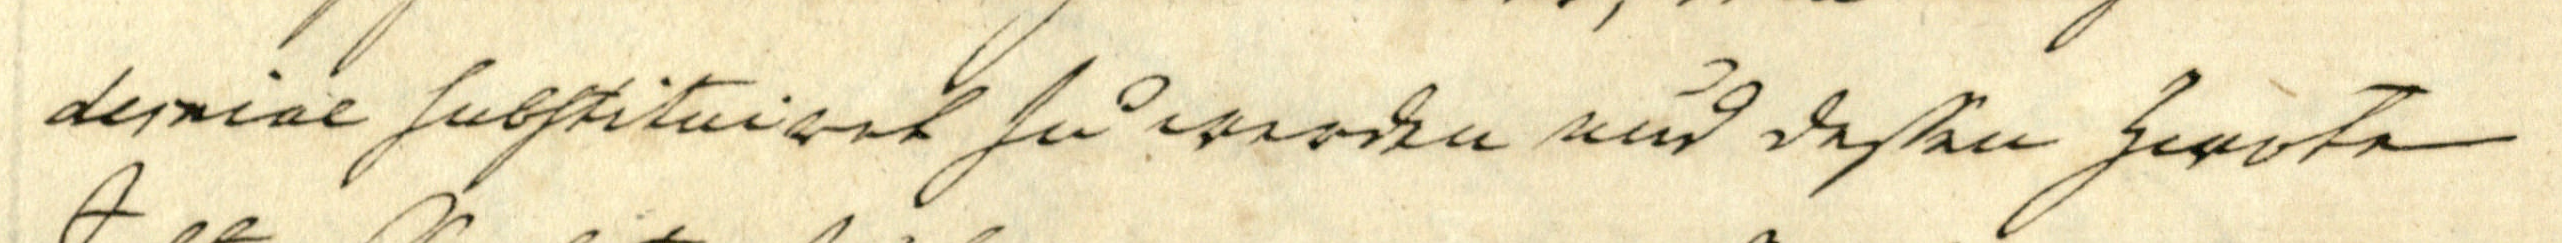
demiae substituiret zu werden und dessen zwote
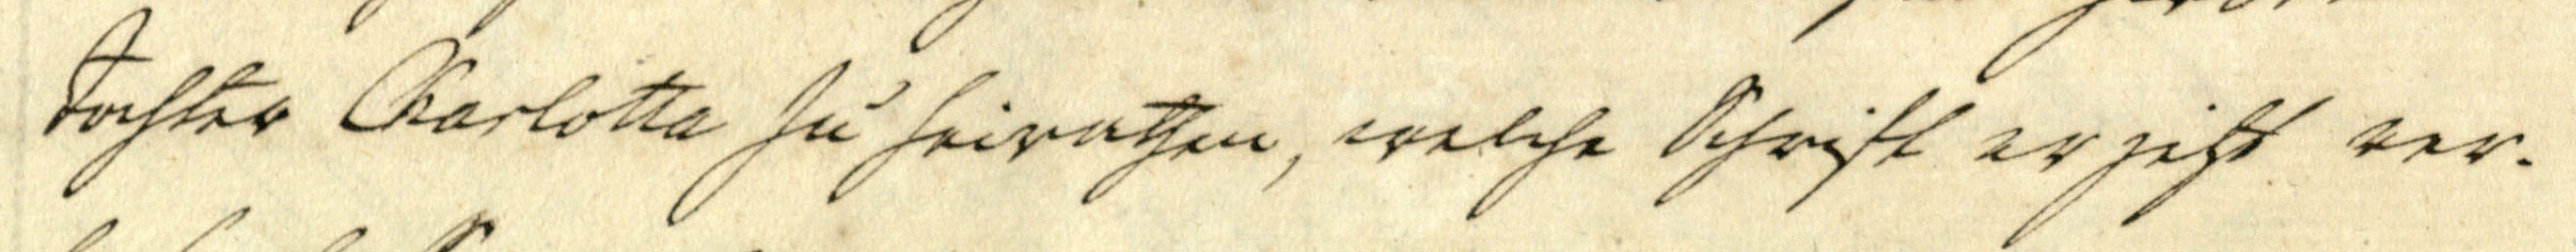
Tochter Charlotta zu heirathen, welche Schrift er jetzt ver¬
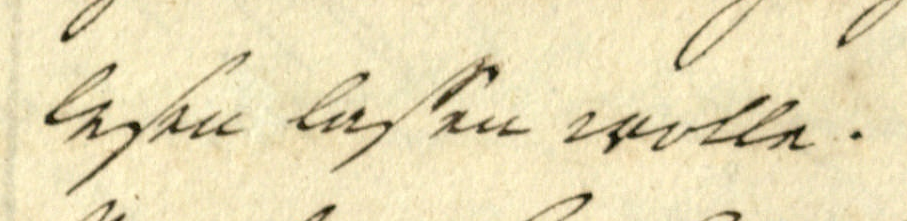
lesen lassen wolle.
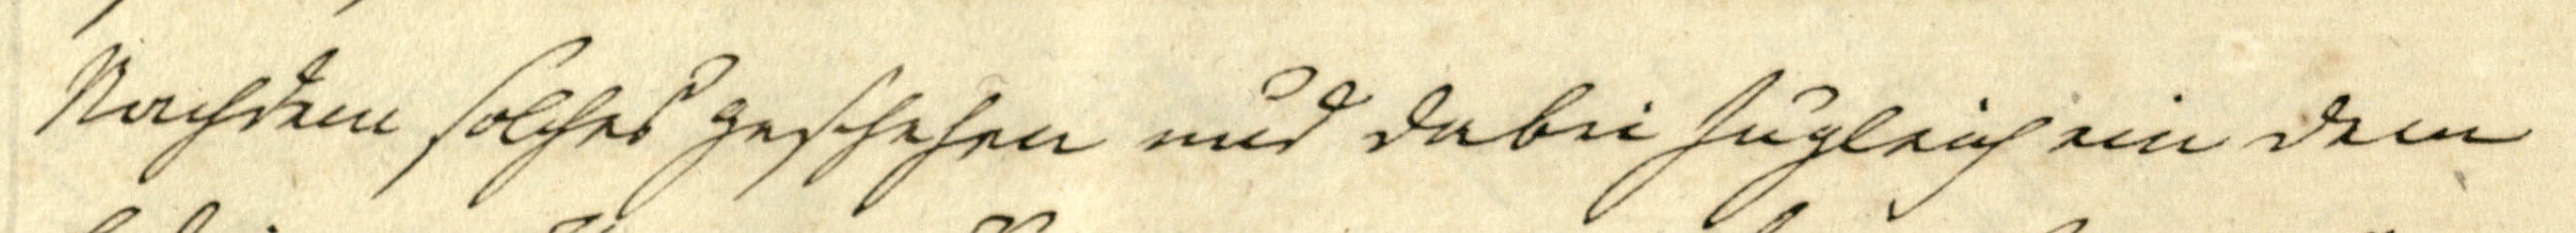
Nachdem solches geschehen und dabei zugleich ein dem
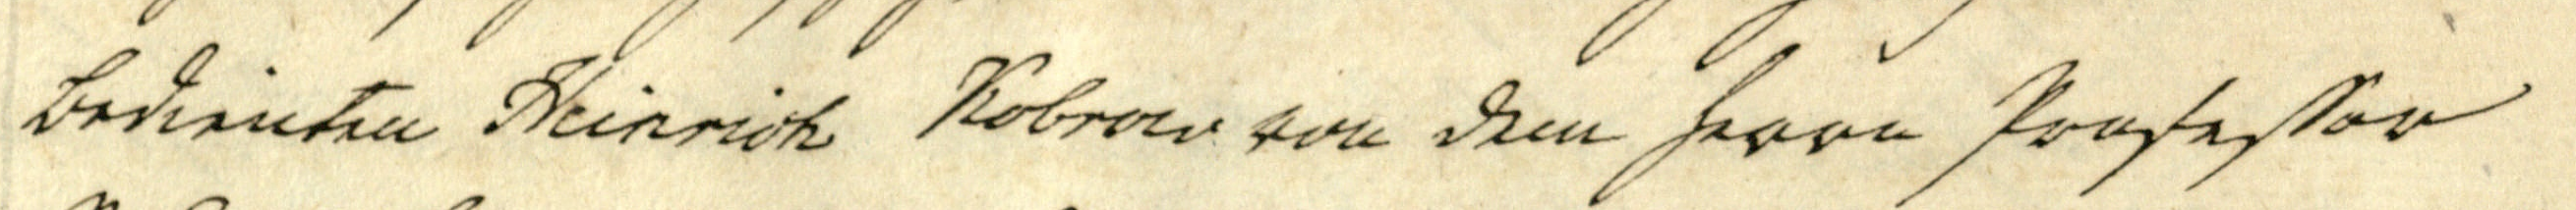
Bedienten Heinrich Kobrow von dem herrn Professor
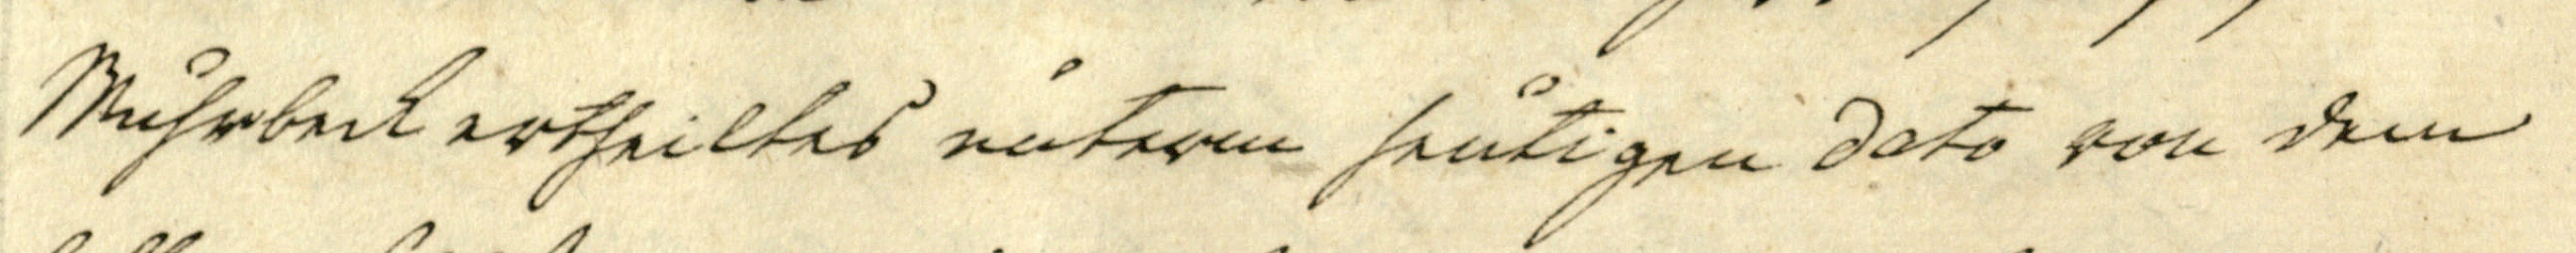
Muhrbeck ertheiltes unterm heutigen dato von dem
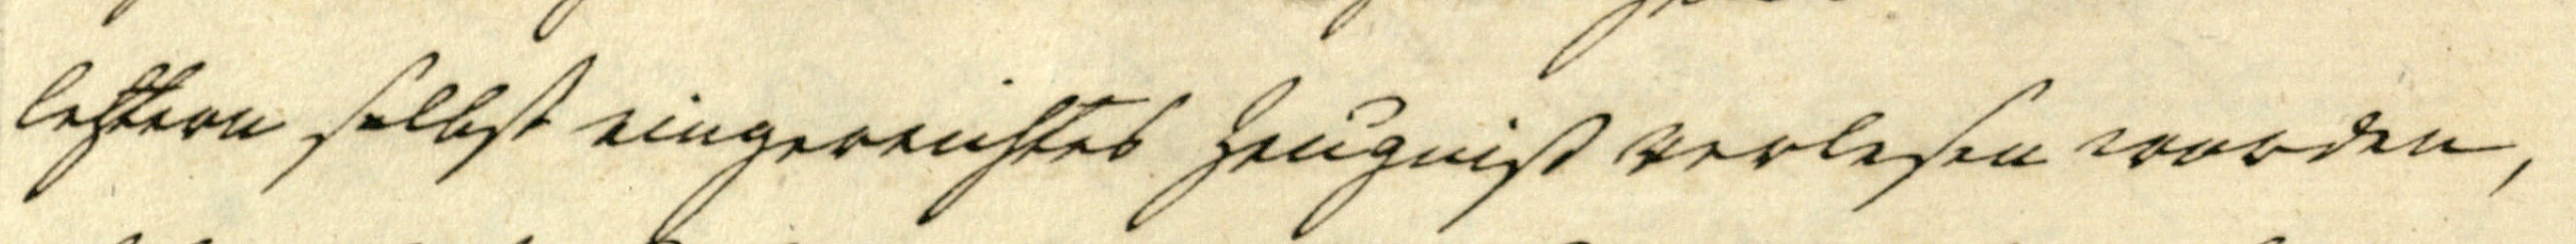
letztern selbst eingereichtes Zeugniß verlesen worden,
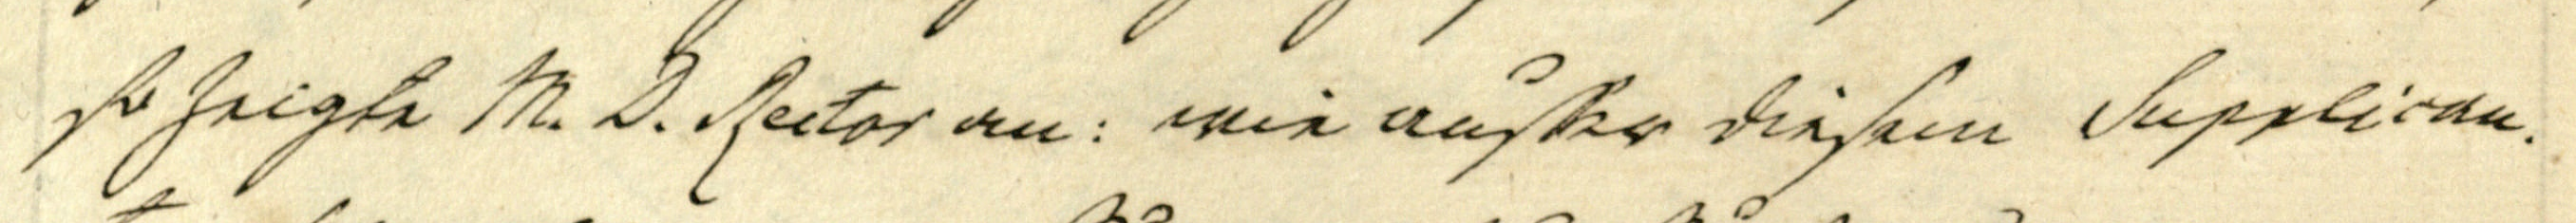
so zeigte M. D. Rector an: wie außer diesem Supplican¬
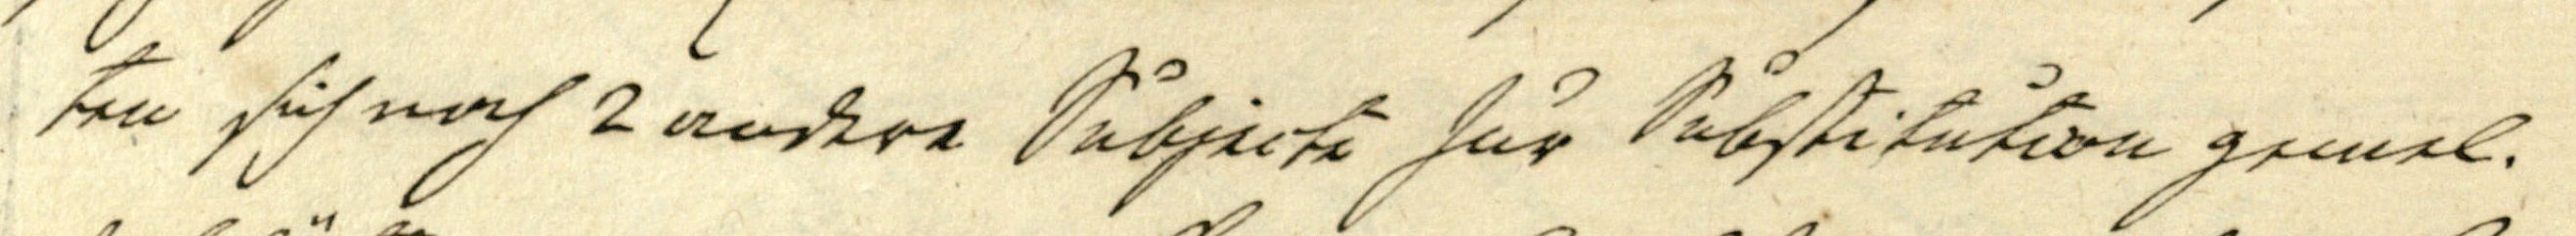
ten sich noch 2 andere Subjecte zur Substitution gemel¬
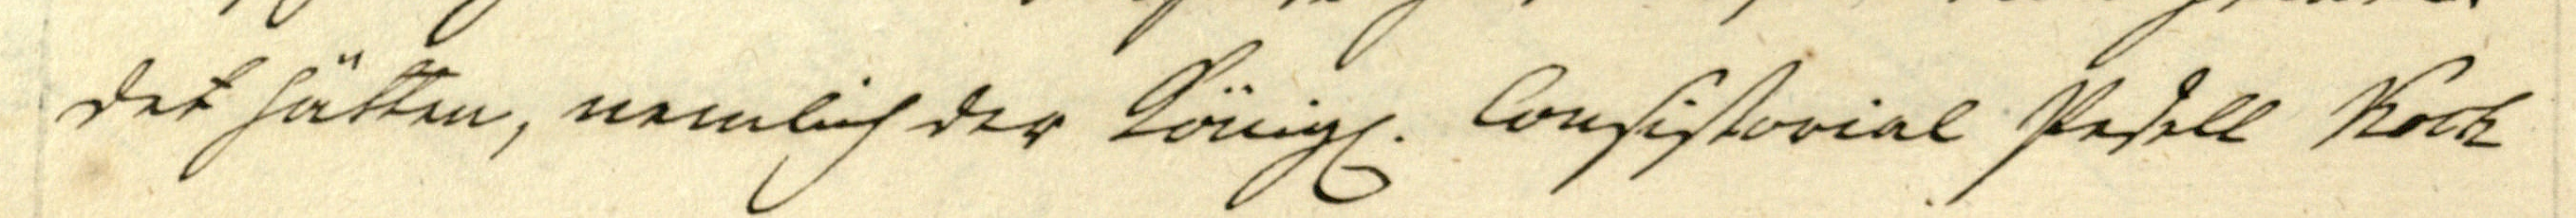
det hätten, nemlich der Königl. Consistorial Pedell Koch
